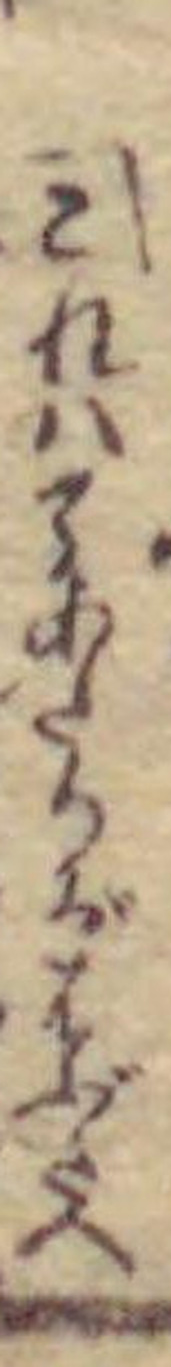〽これはてあたりがはぶたへ
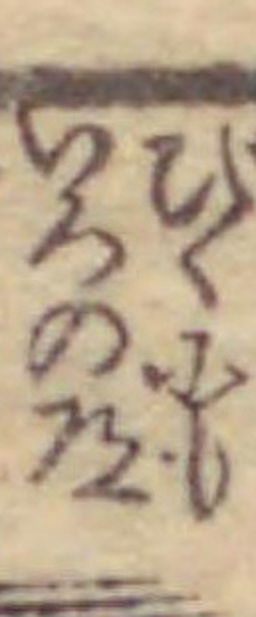いろの道
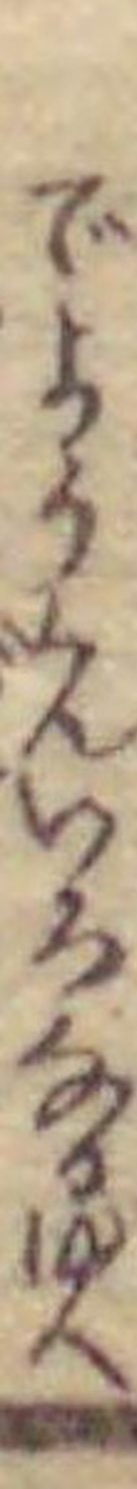でようくんいろなるゆへ
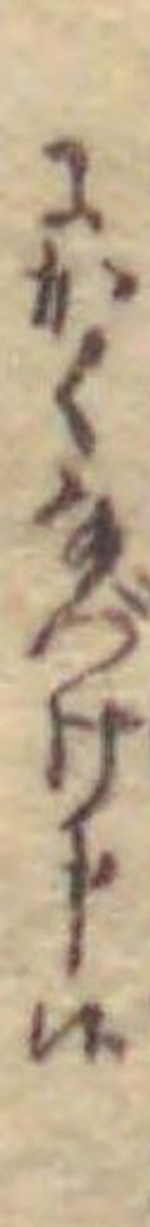にかくなづけ申候
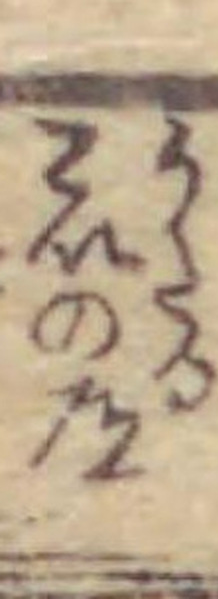こいの道
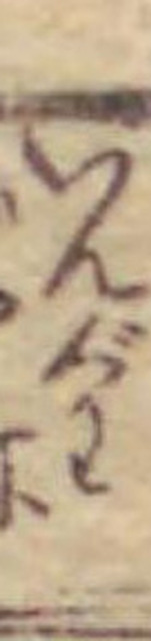いんぐわ
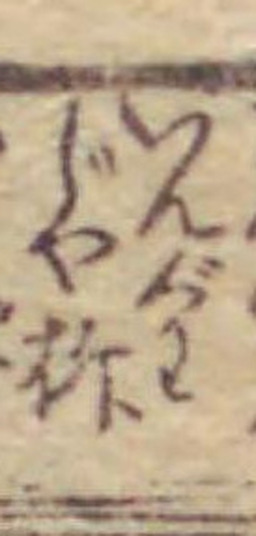じやね
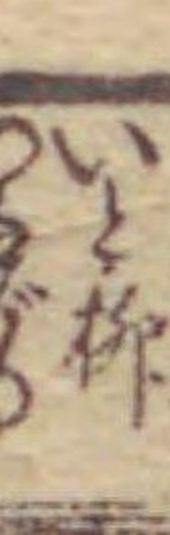いと柳
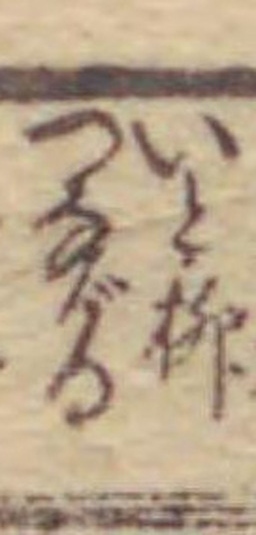つながる
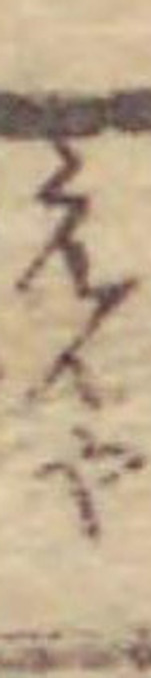えんや
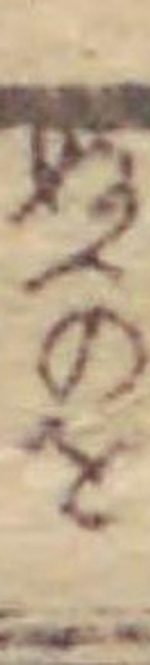ぬへのを
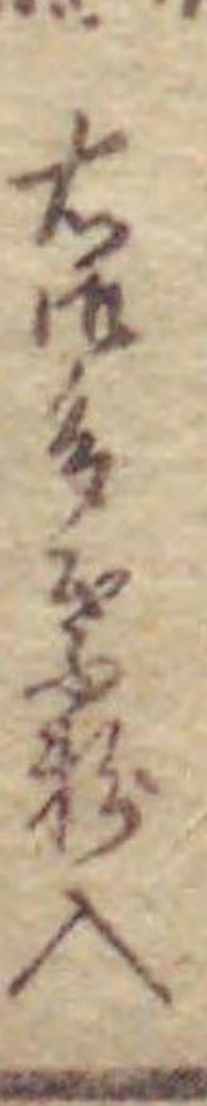右御多葉粉入
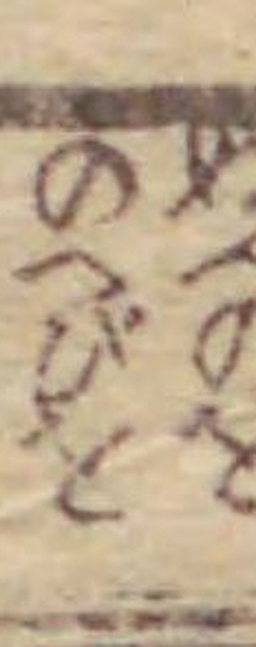のへびを
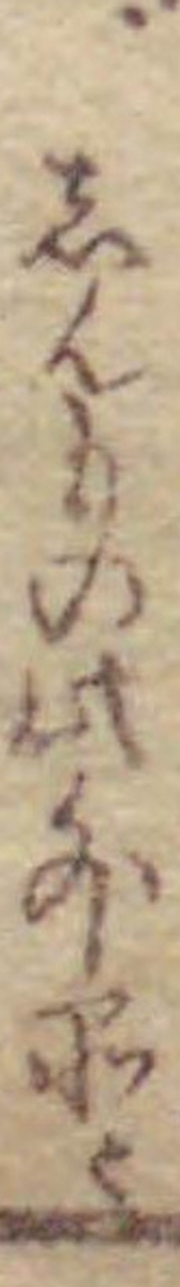しんもの此外品々
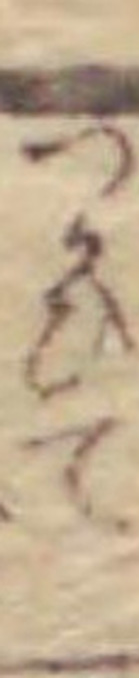つかひて
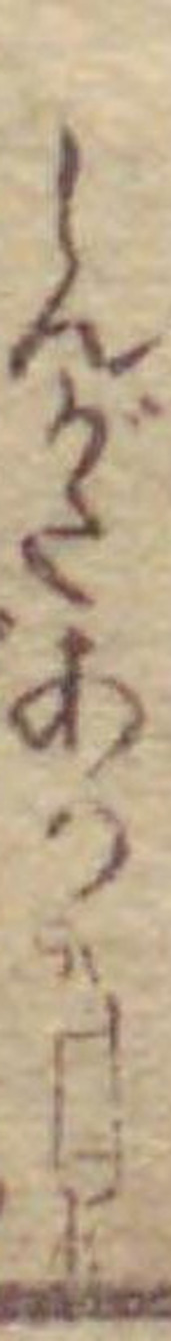しんがたあり
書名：御誂染長寿小紋 : 3巻
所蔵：国立国会図書館 National Diet Library, JAPAN
